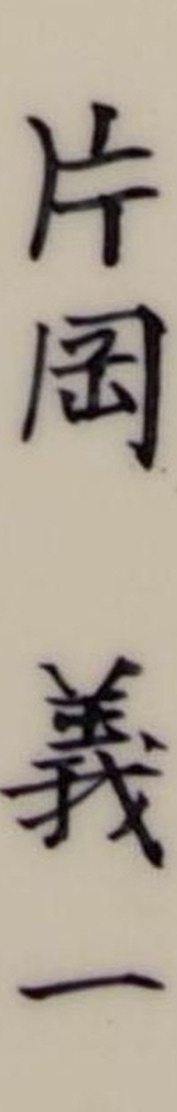片岡義一
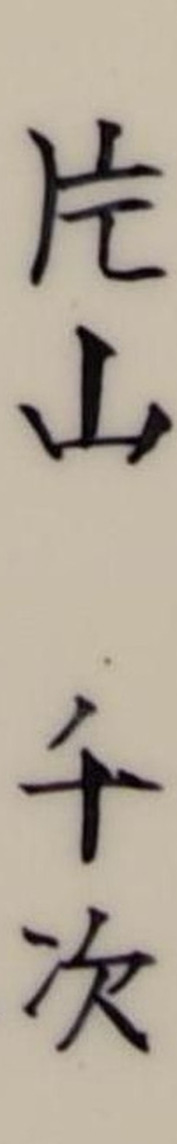片山千次
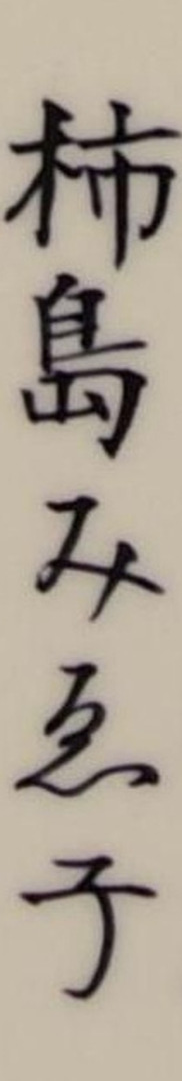柿島みえ子
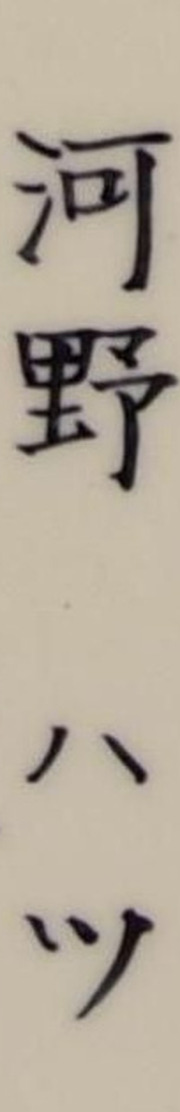河野ハツ
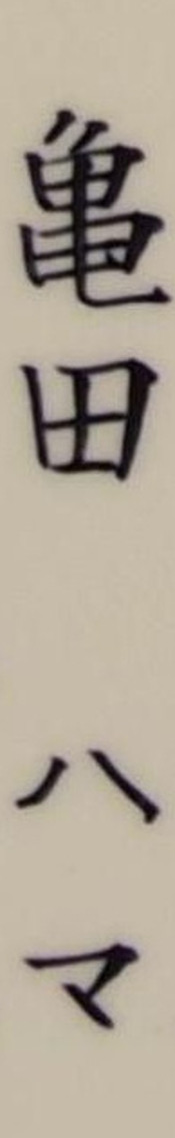亀田ハマ
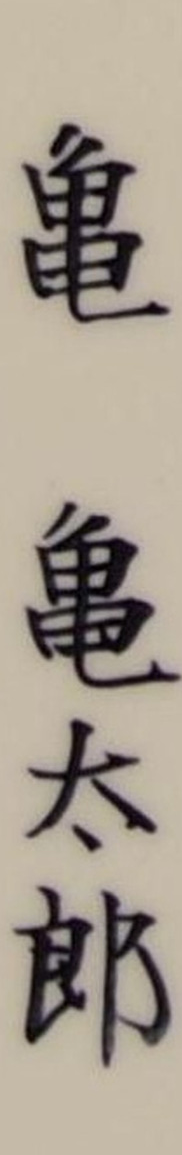亀亀太郎
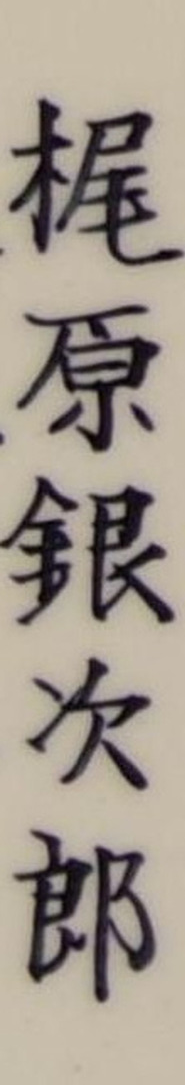梶原銀次郎
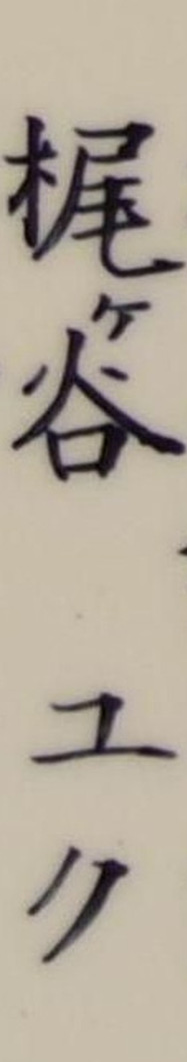梶ヶ谷ユク

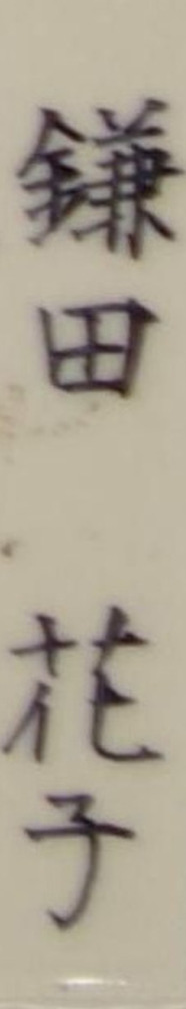鎌田花子
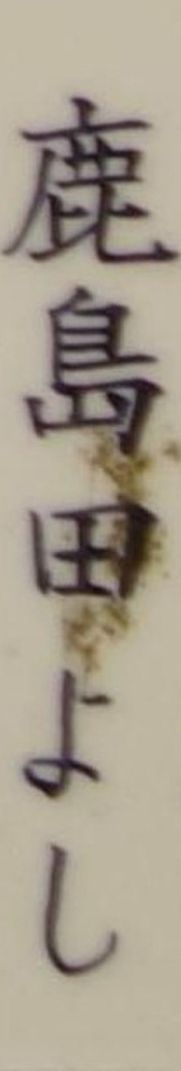鹿島田よし
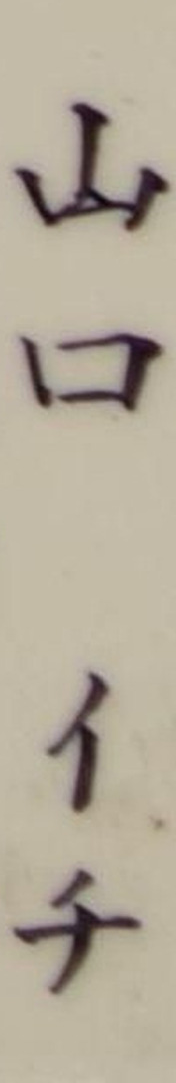山口イチ
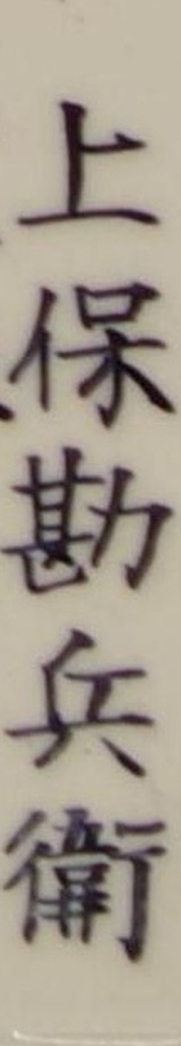上保勘兵衛
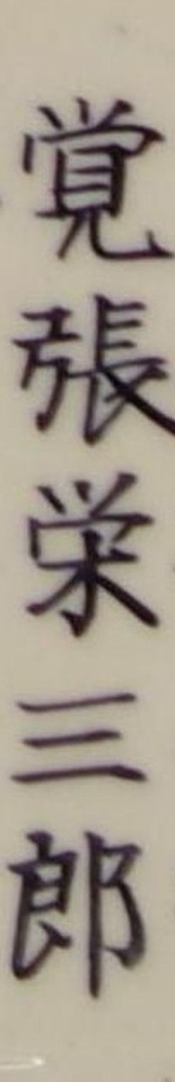覚張栄三郎
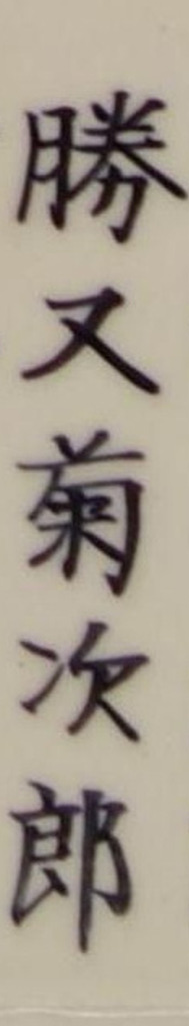勝又菊次郎
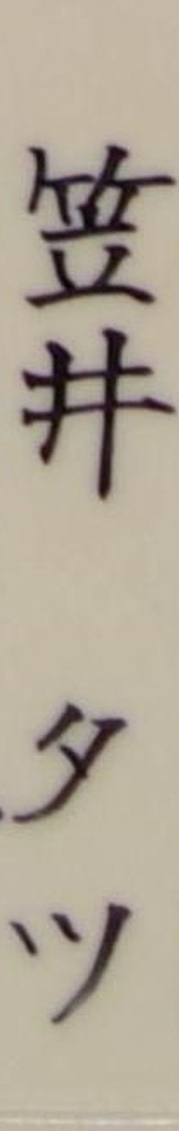笠井タツ
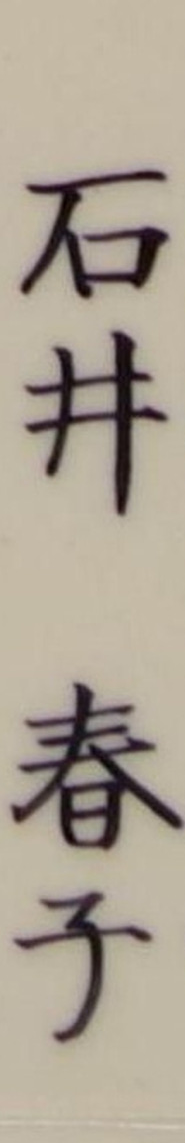石井春子
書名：E~L
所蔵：高野山金剛峯寺
